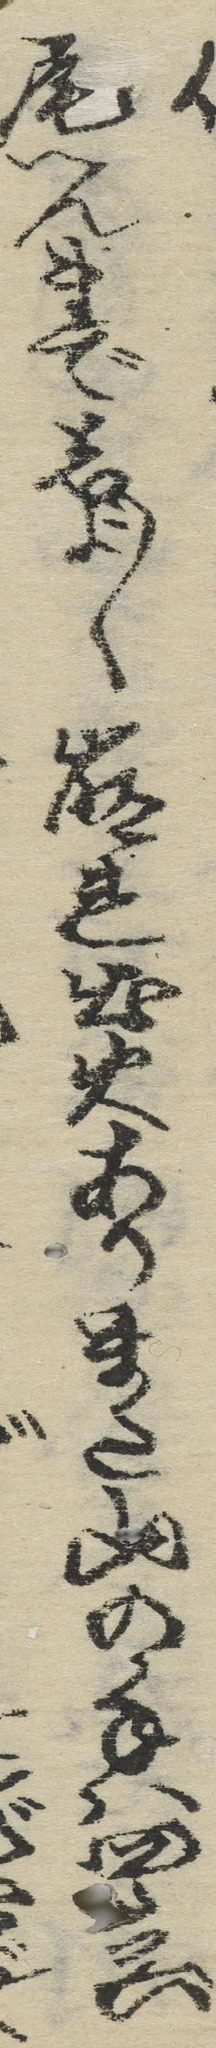尾へんまでしよ〳〵崩れ出火ありまた山の手ハ四ッ谷
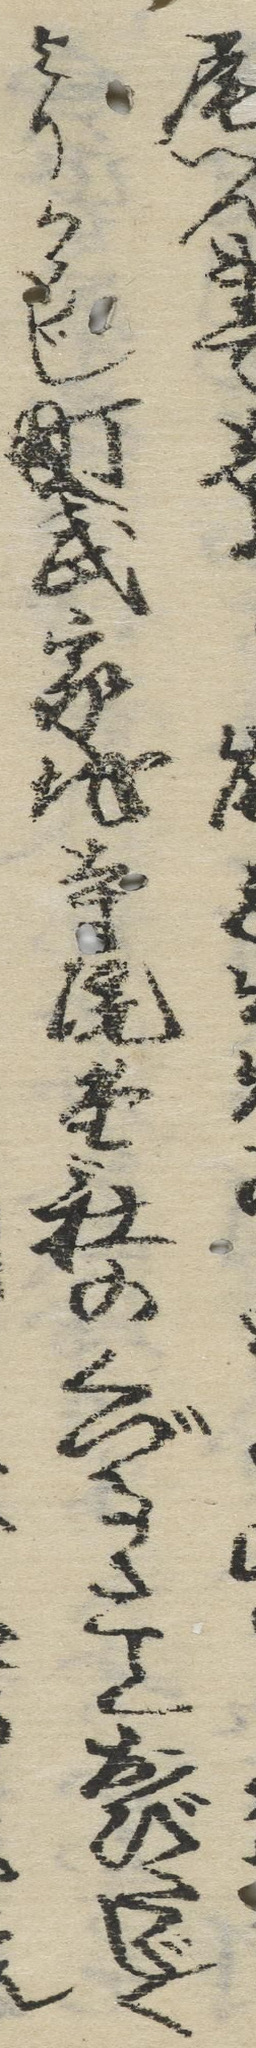よりかうじ町武家地寺院堂社のくづるゝことおびたゞしく
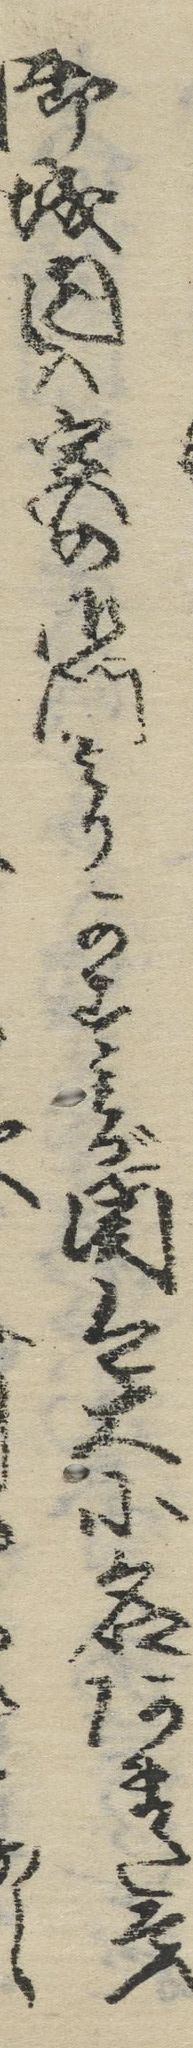御城内ハ巽？の御門よりかすミが関は大小名あまたそん
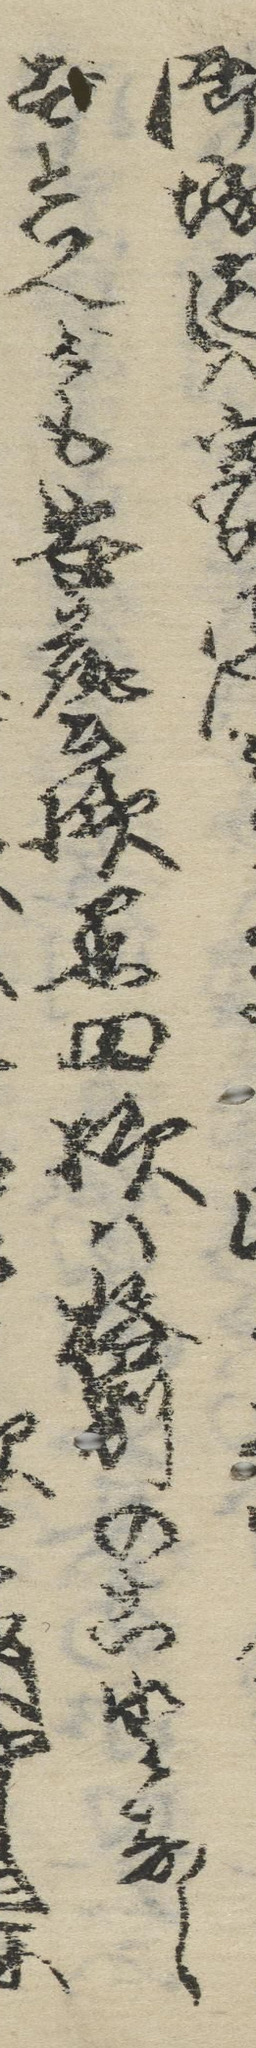ずといへども安芸公様黒田様ハ格別のことなし
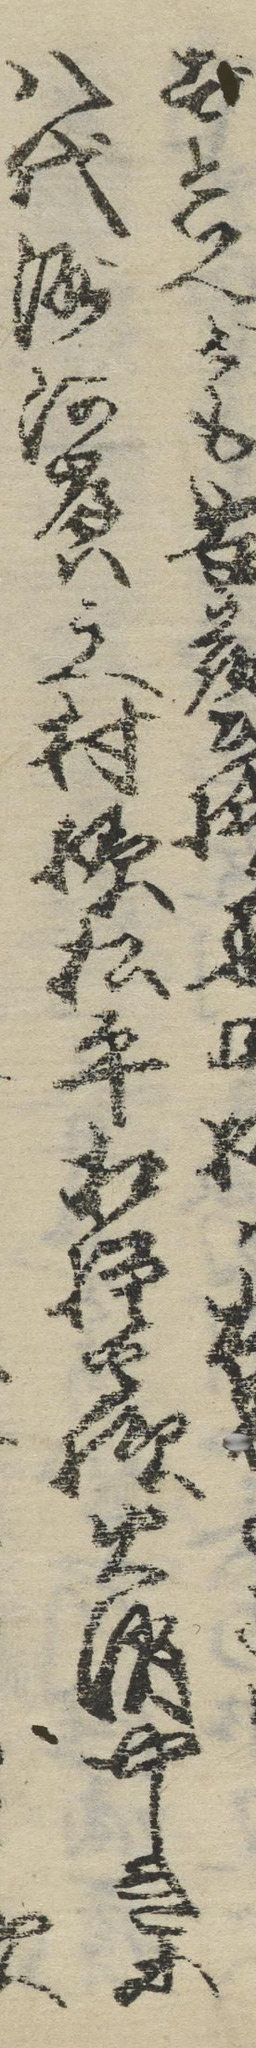八代洲河岸ハうへ村様松平相模守様火消やしき等
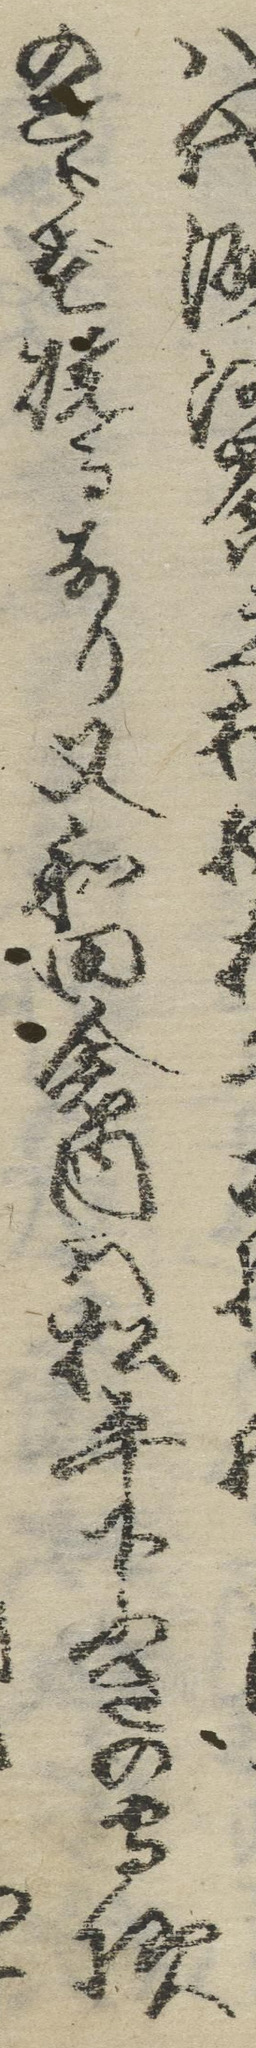のこらず焼るなり又和田倉内ハ松平下ふさの守様
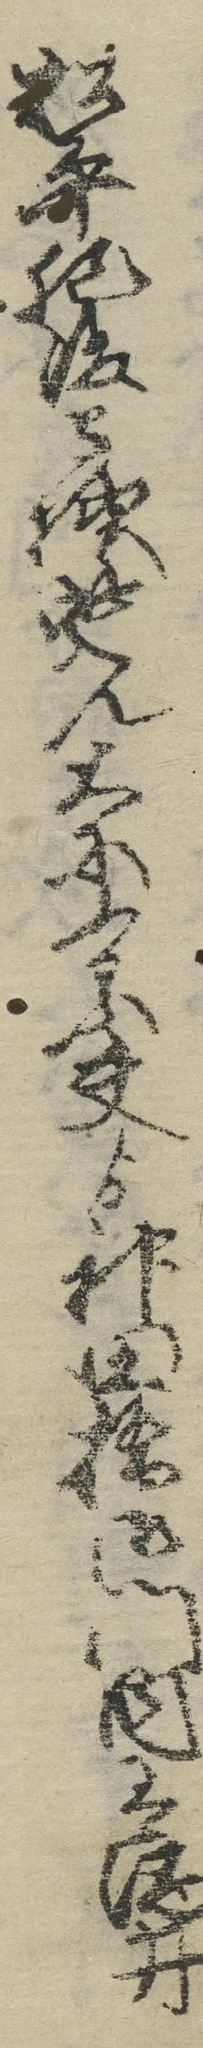松平肥後守様此へん大にふるふ夫ゟ神田橋御門内は酒井

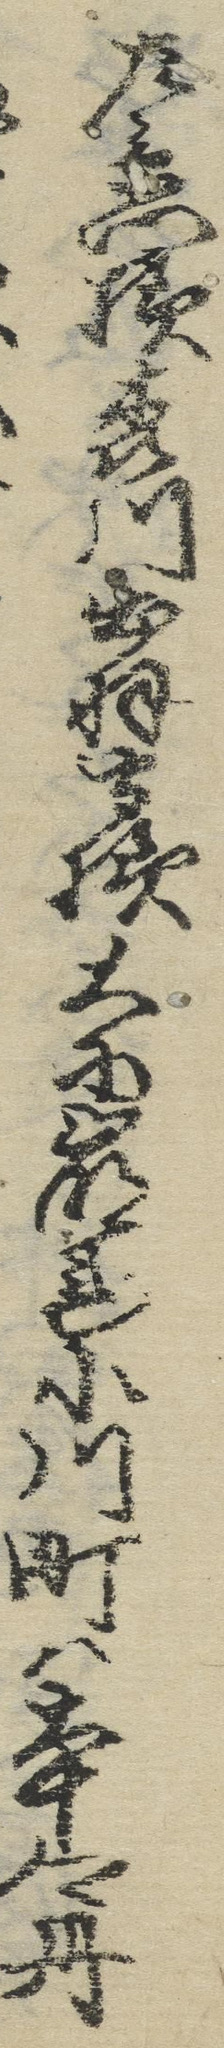左衛門様森川出羽守様大に崩れ小川町ハ本郷丹
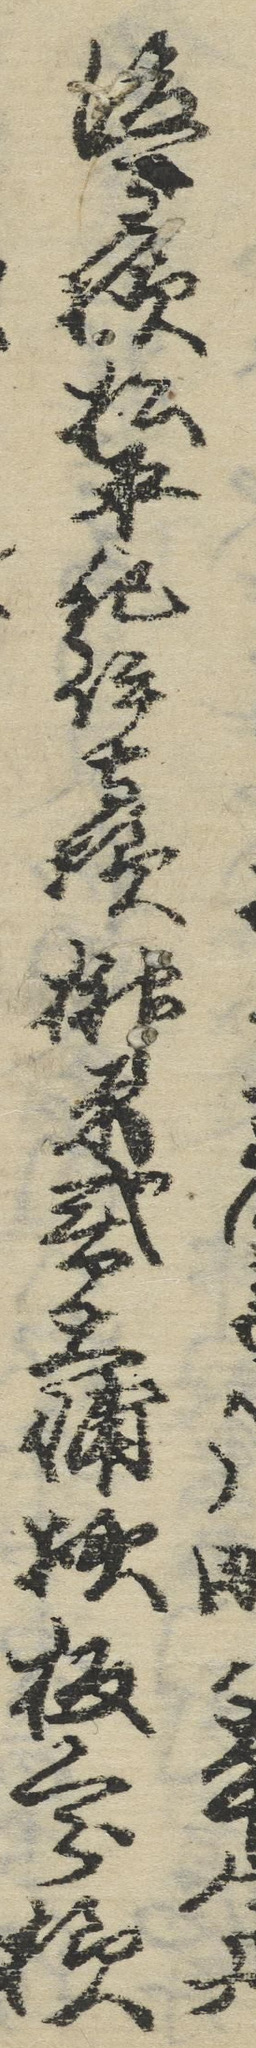後守様松平紀伊守様榊原式部大輔様板くら様
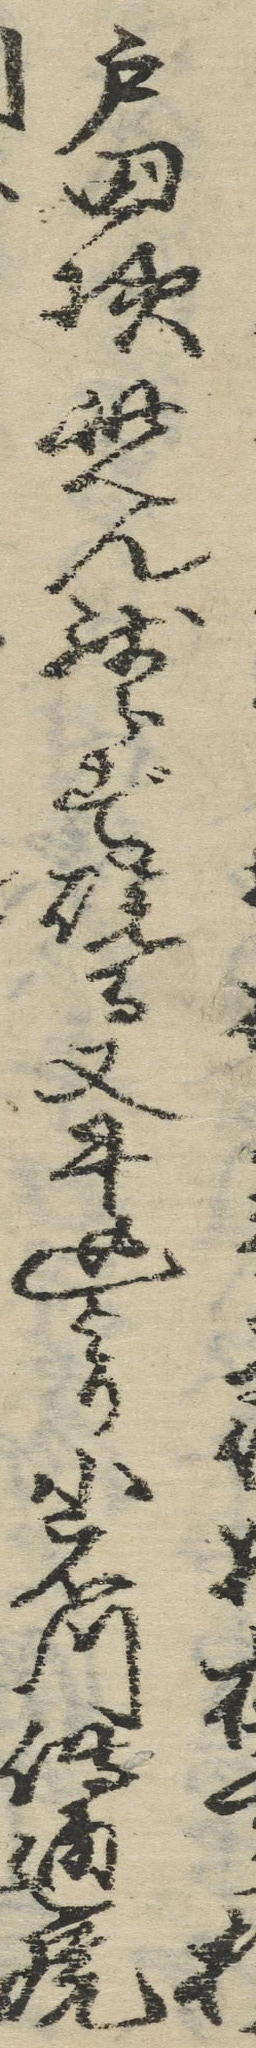戸田様此へん残らず焼る又牛込より小石川伝通院
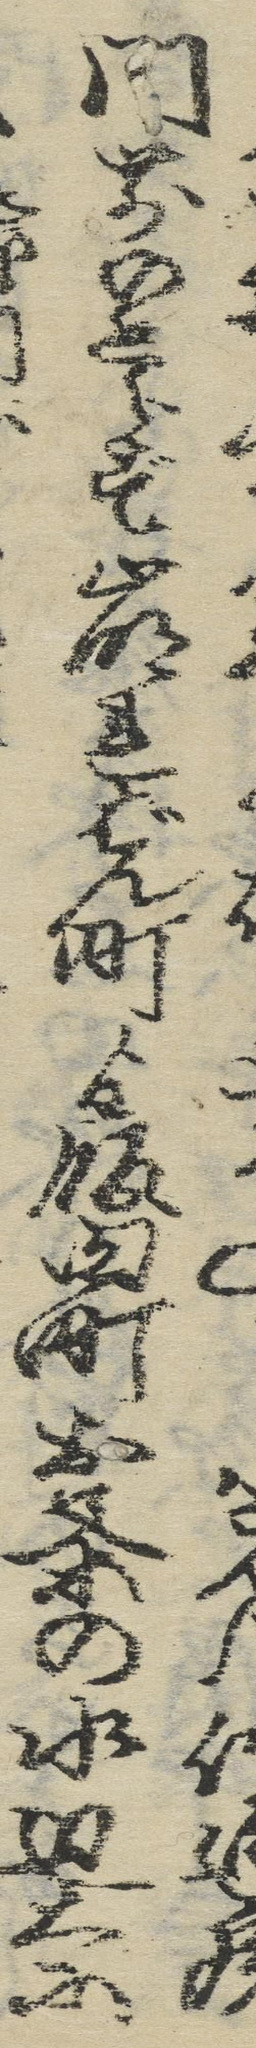門前のこらず崩ればん町ゟ飯田町お茶の水辺大に
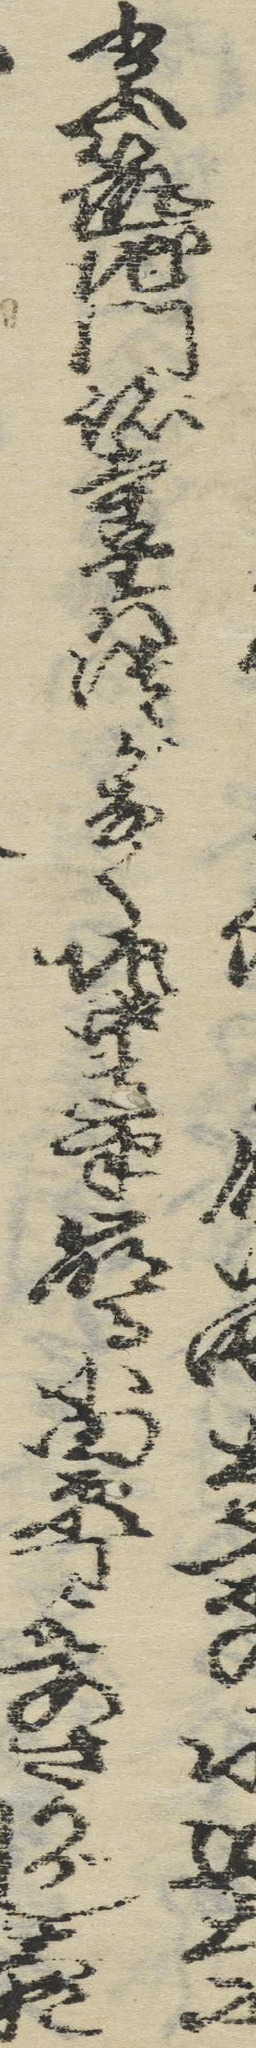ふるふ築地門諸寺堂ハつゝがなく地中過半崩る小田弐丁ゟあさりがし大抵
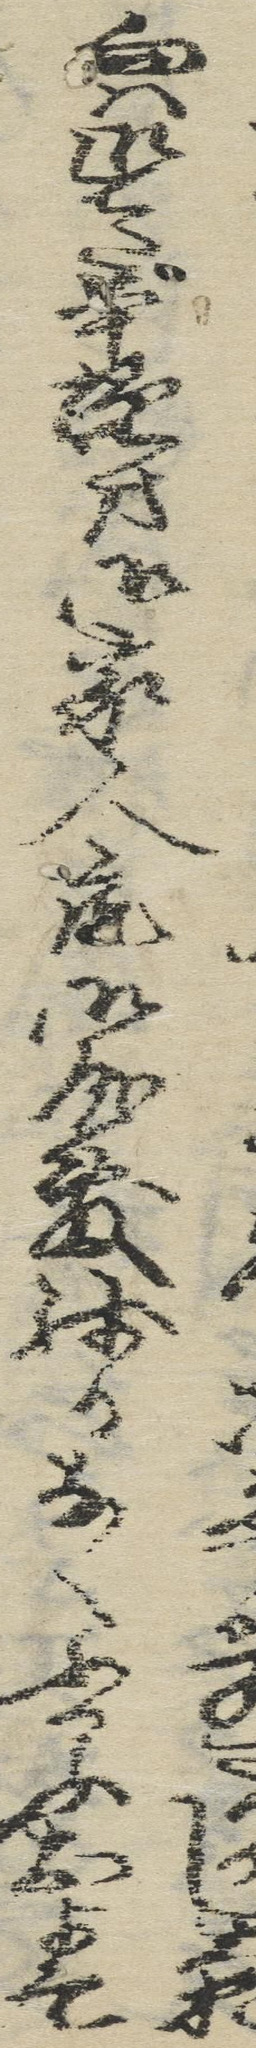向ハ御はた本鑓？方御家人衆御屋敷残りなくふるふおよそ
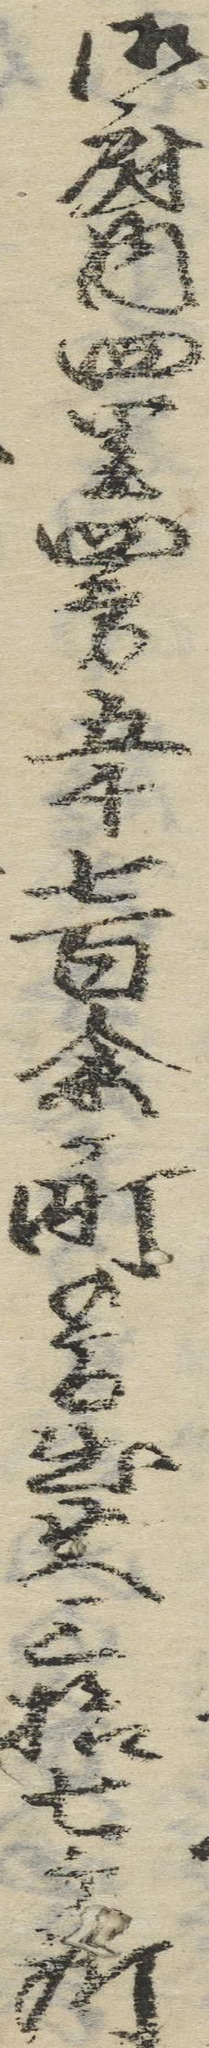御府内四里四方五千七百余か町の方？出火三拾七ヶ所
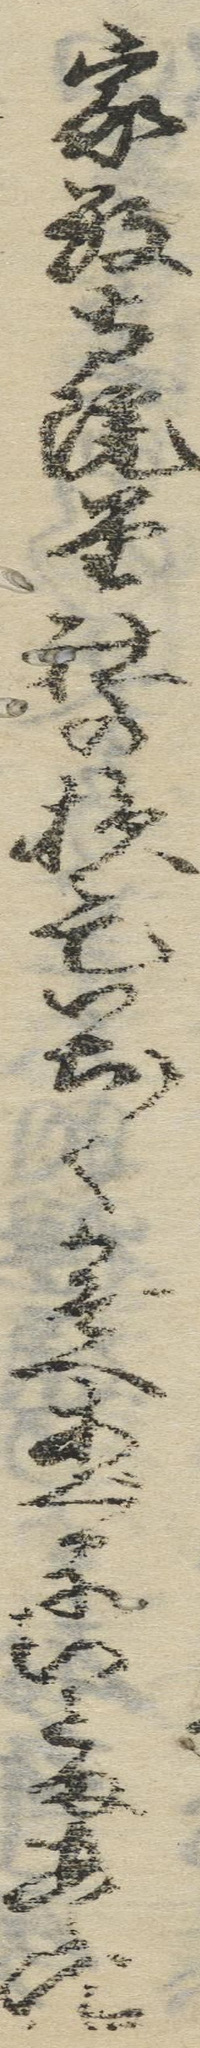家数寺院堂社の損亡いち〳〵かぞへあぐるにいとまあらず
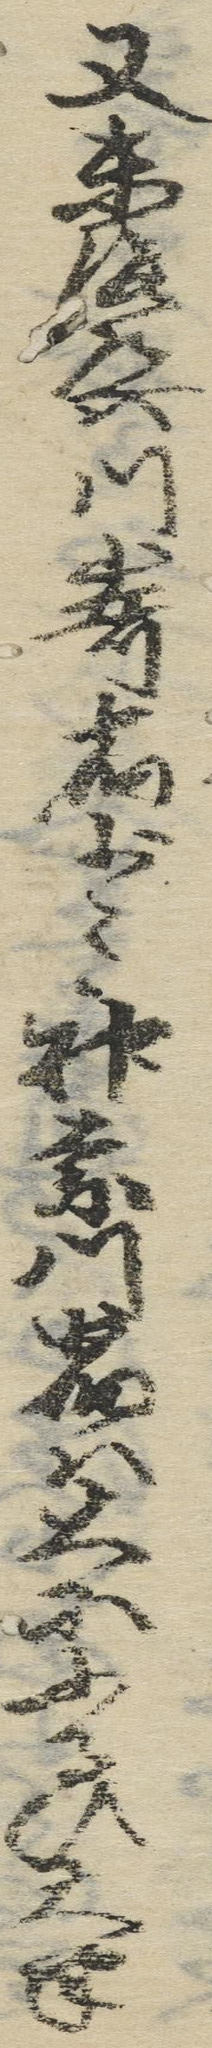又東海道ハ川崎宿少々神奈川宿ハ大にふるひ大半
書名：御府内五街道　大地しん
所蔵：東京大学地震研究所図書室 Earthquake Research Institute Library, The University of Tokyo, JAPAN
